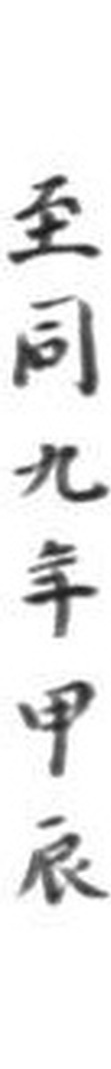至同九年甲辰

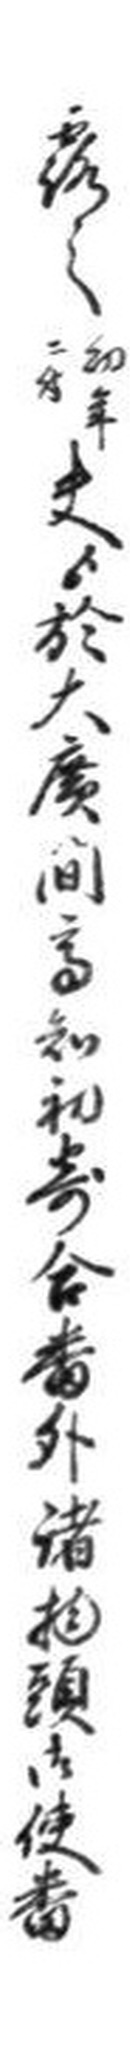ニ付夫ゟ於大広間高知初寄合番外諸物頭御使番
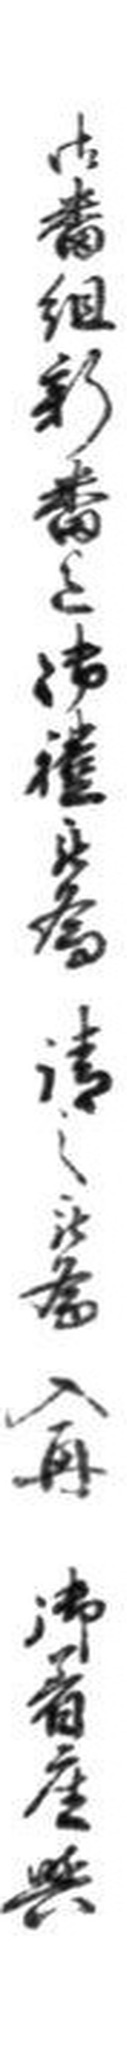御番組新番迄御礼被為請之被為入再御着座与
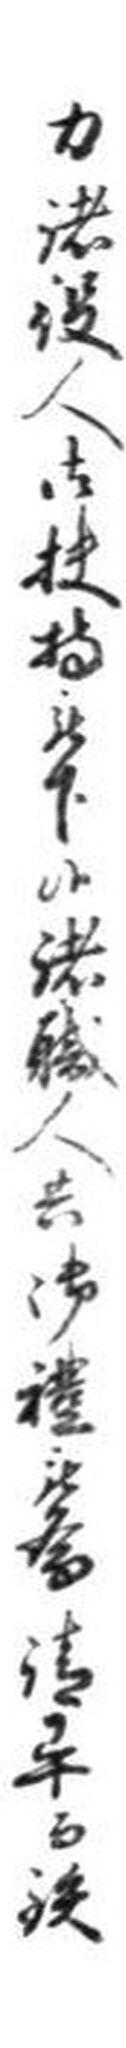力諸役人御扶持被下候諸職人共御礼被為請畢而鉄
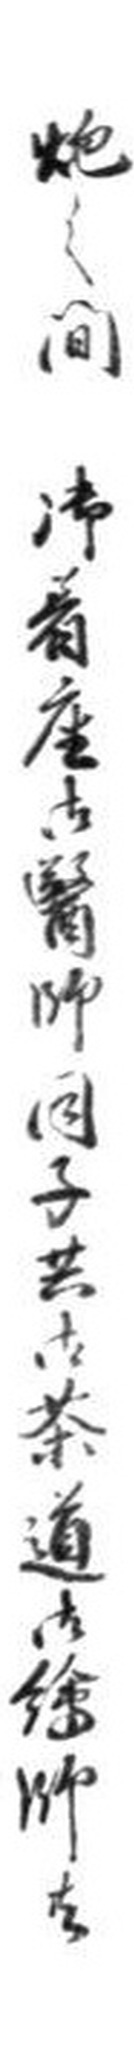炮之間御着座御医師同子共御茶道御絵師共
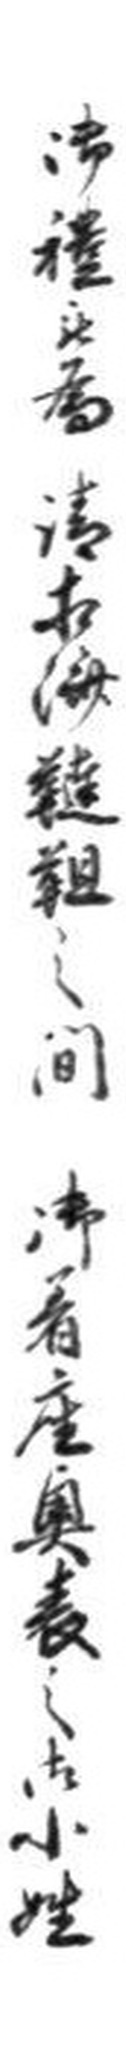御礼被為請相済韃靼之間御着座奥表之御小姓
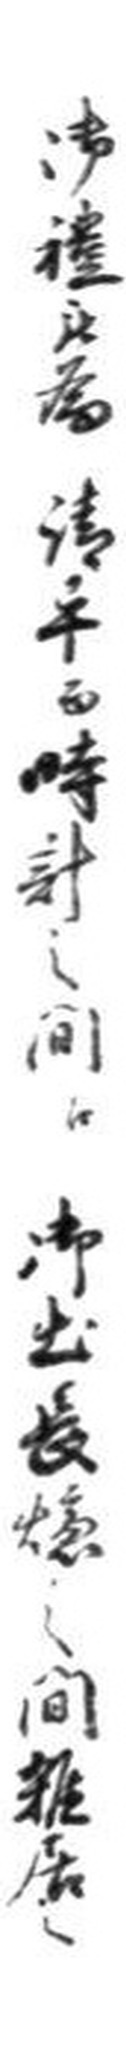御礼被為請畢而時計之間江御出長炉之間雑居之
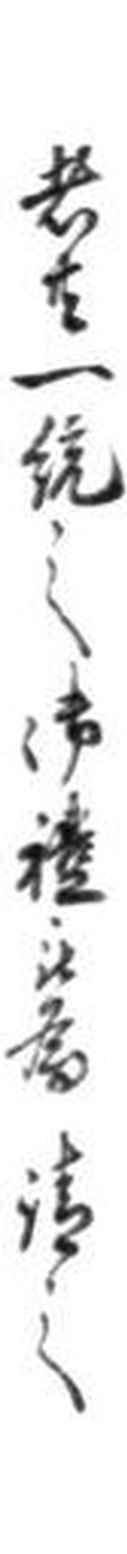者共一統之御礼被為請之
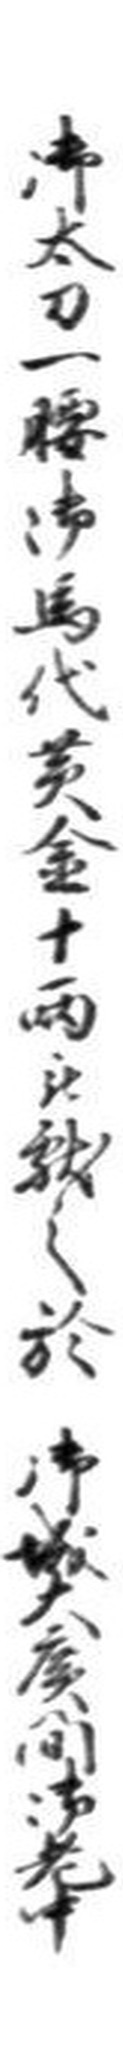御太刀一腰御馬代黄金十両被献之於御城大広間御老中
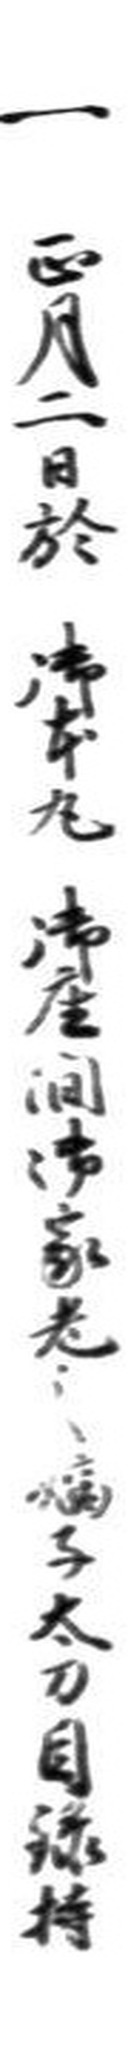一正月二日於御本丸御座間御家老之嫡子太刀目録持
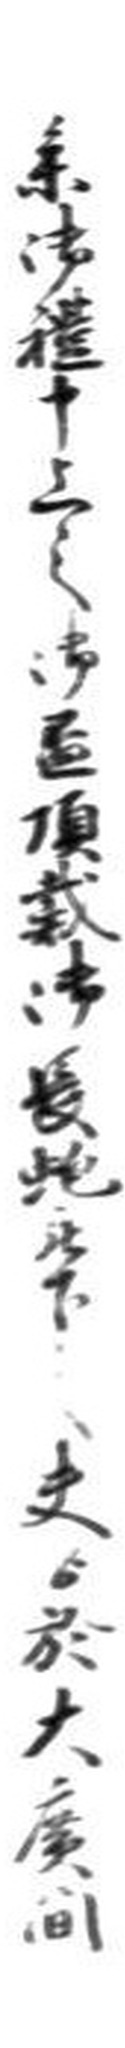参御礼申上之御盃頂戴御長蚫被下之夫ゟ於大広間
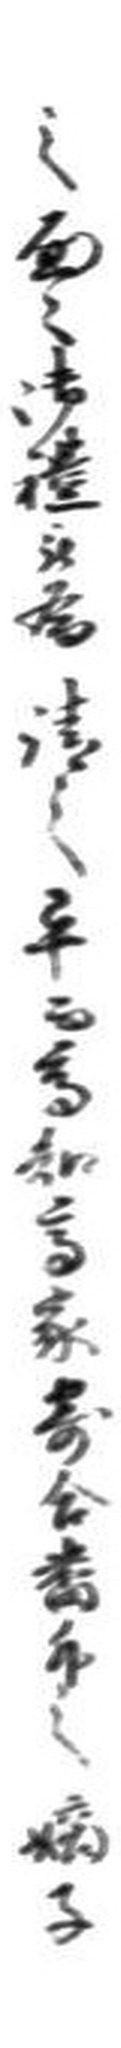之面々御礼被為請之畢而高知高家寄合番外之嫡子
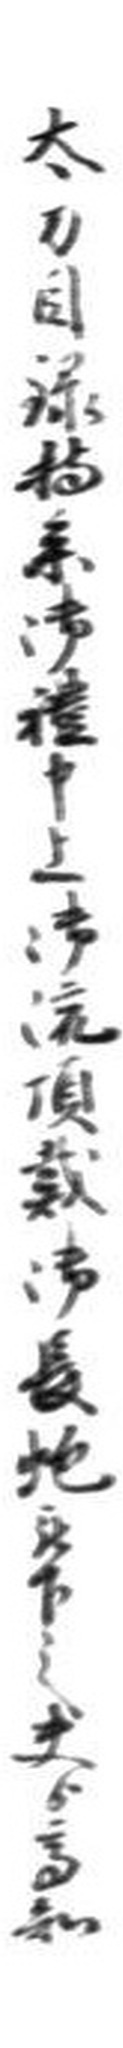太刀目録持参御礼申上御流頂戴御長蚫被下之夫ゟ高知
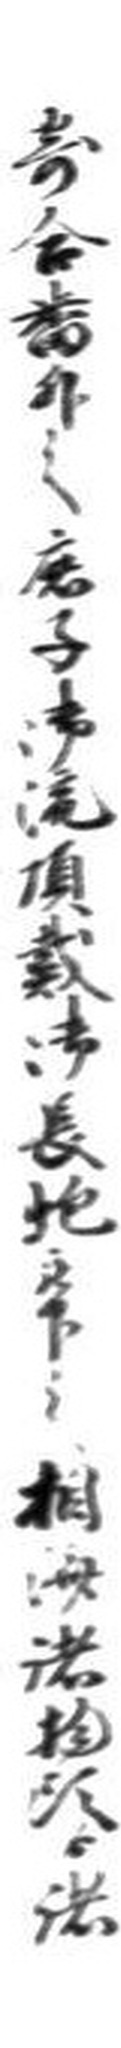寄合番外之庶子御流頂戴御長蚫被下之相済諸物頭ゟ諸
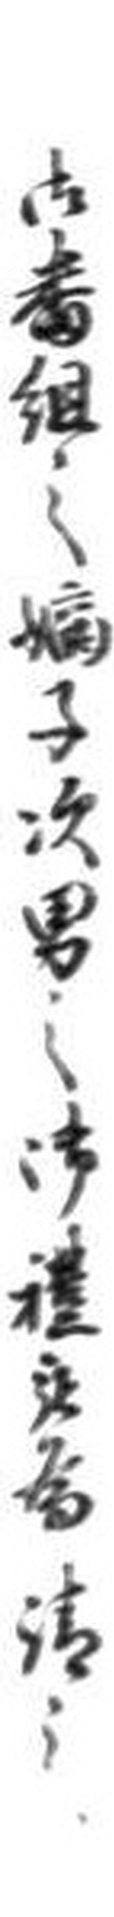御番組之嫡子次男之御礼被為請之
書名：家譜 三十六 宗昌公 従享保八年到同九年
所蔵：福井県文書館 Fukui Prefectural Archives
